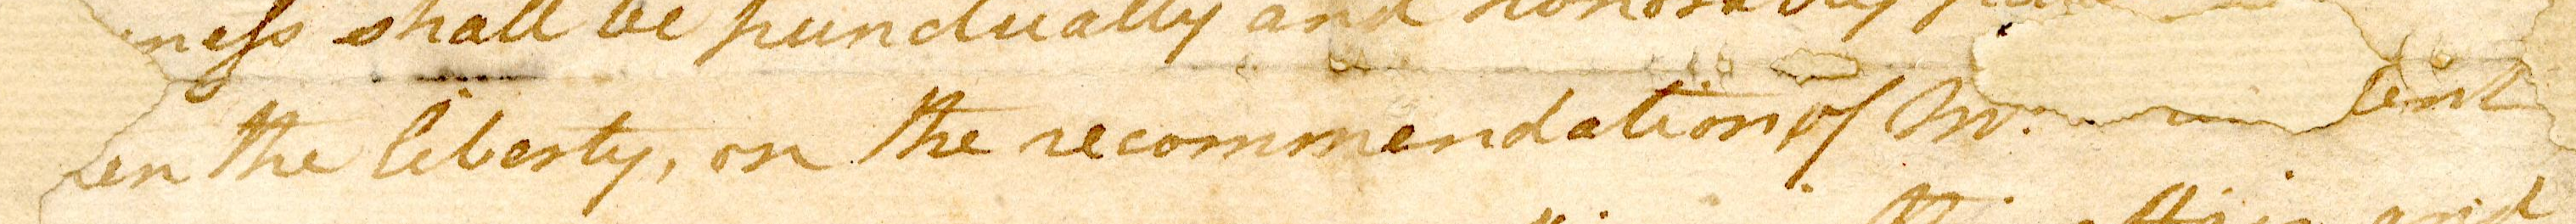ken the liberty, on the recommendation of [______]en
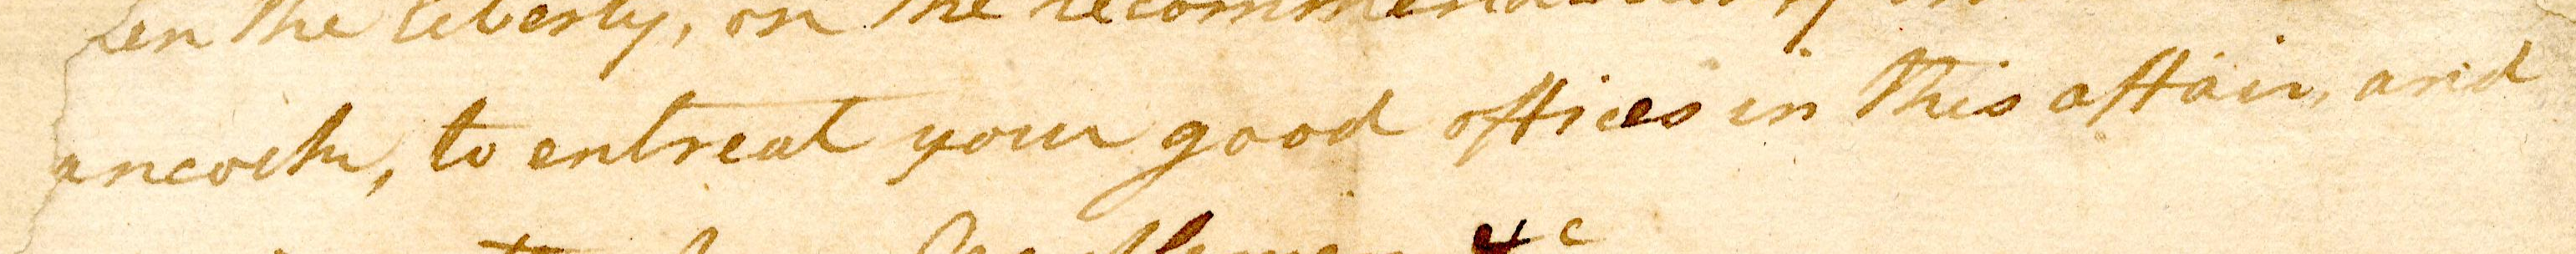ancock, to entreat your good offices in this affair, and
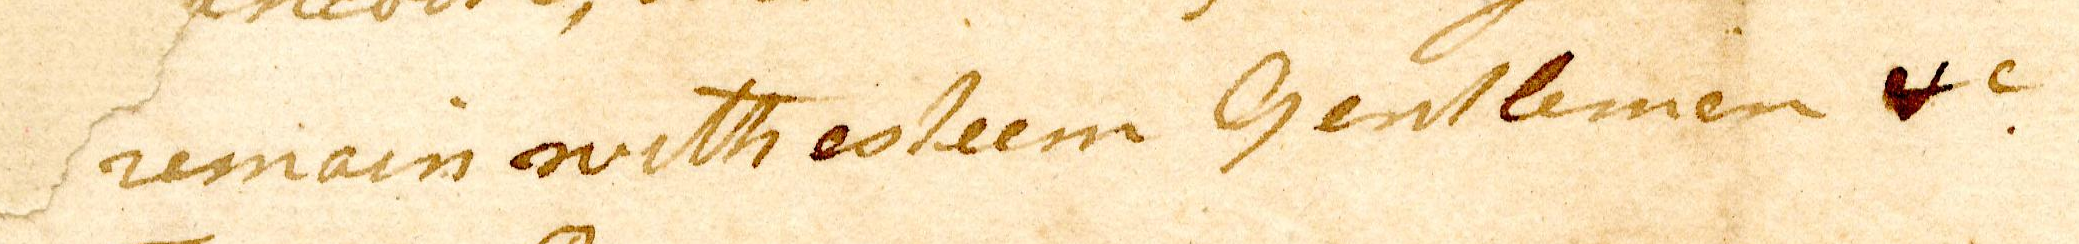remain with esteem Gentlemen &^c.
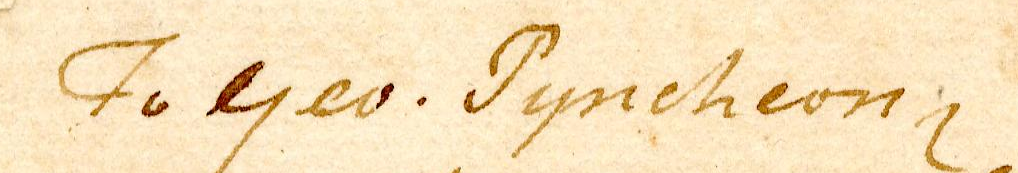To Geo. Pynchon,
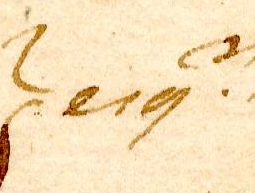esq^r.
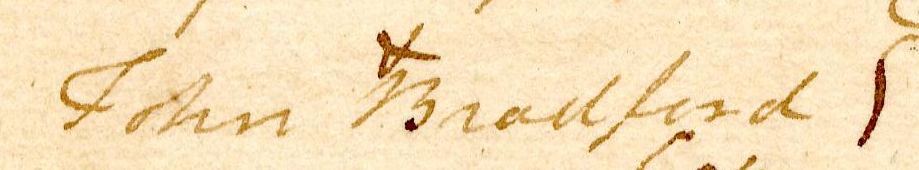John Bradford
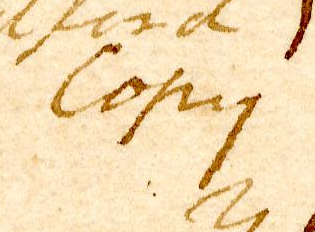Copy
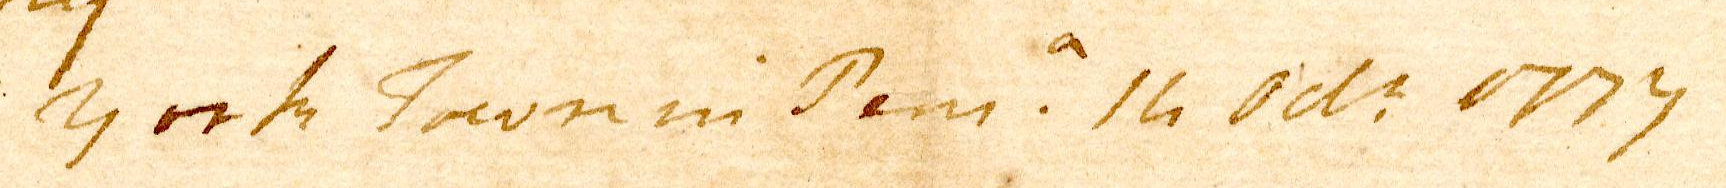York Town in Pens^a. 14 Oct^r. 1777
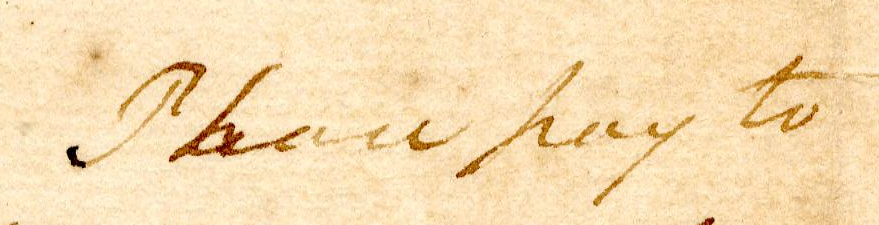Please pay to
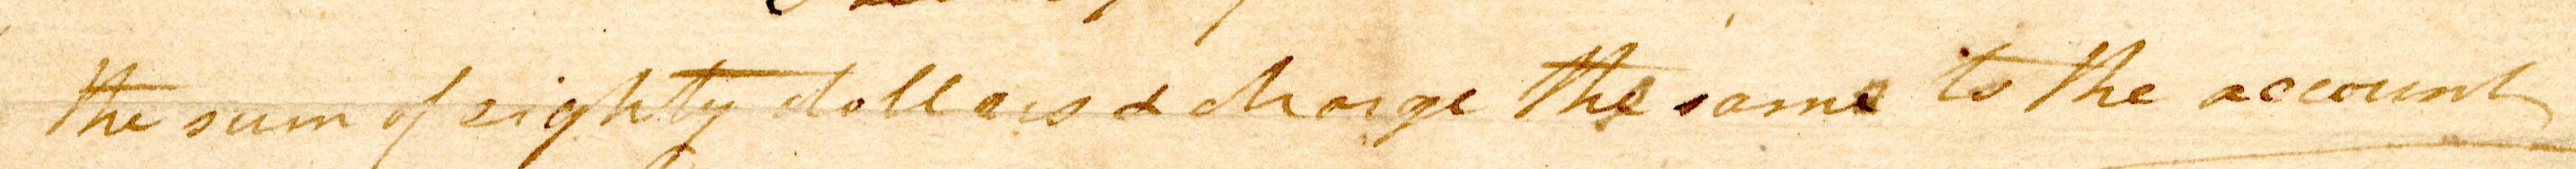the sum of eighty dollars & charge the same to the account
